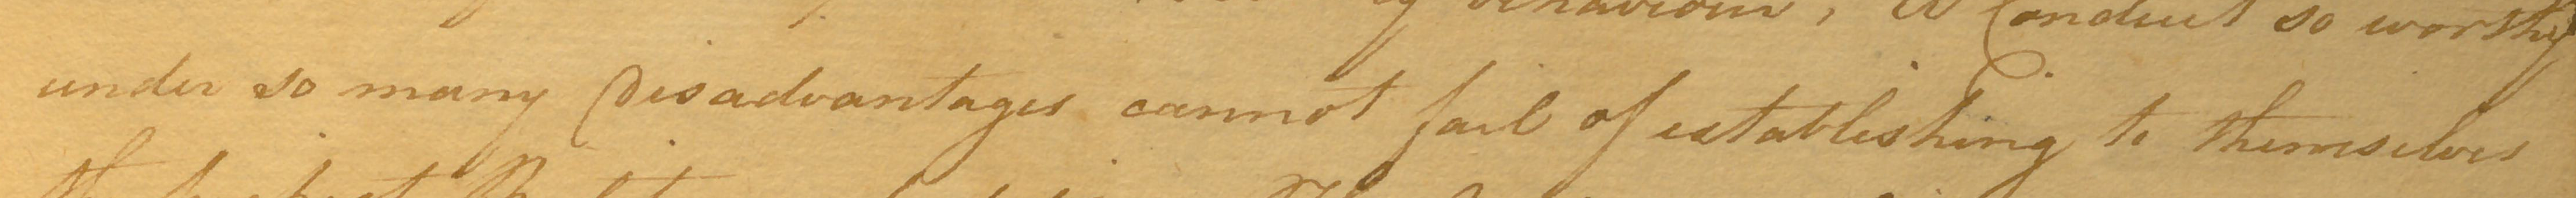under so many disadvantages cannot fail of establishing to themselves
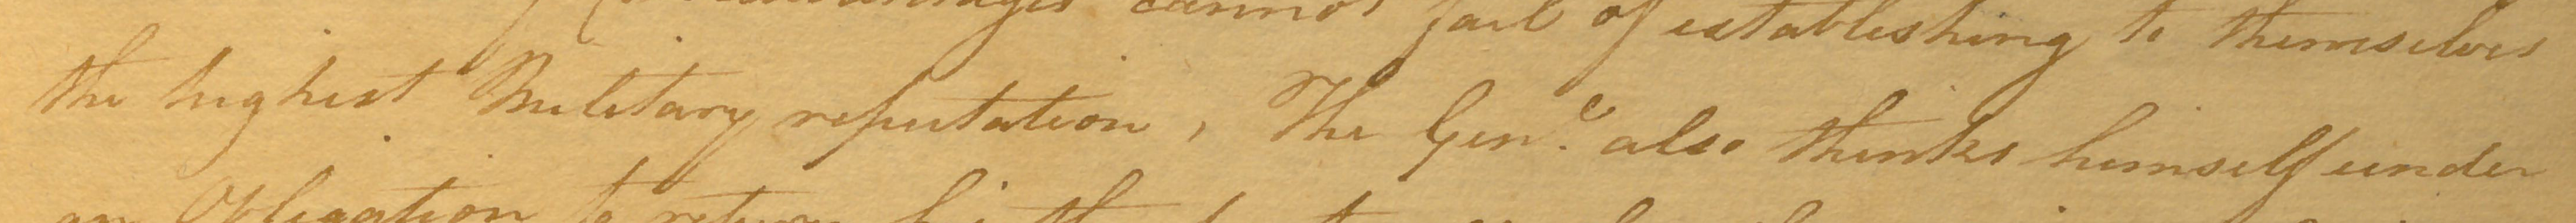the highest Military reputation, The Gen^l. thinks himself under
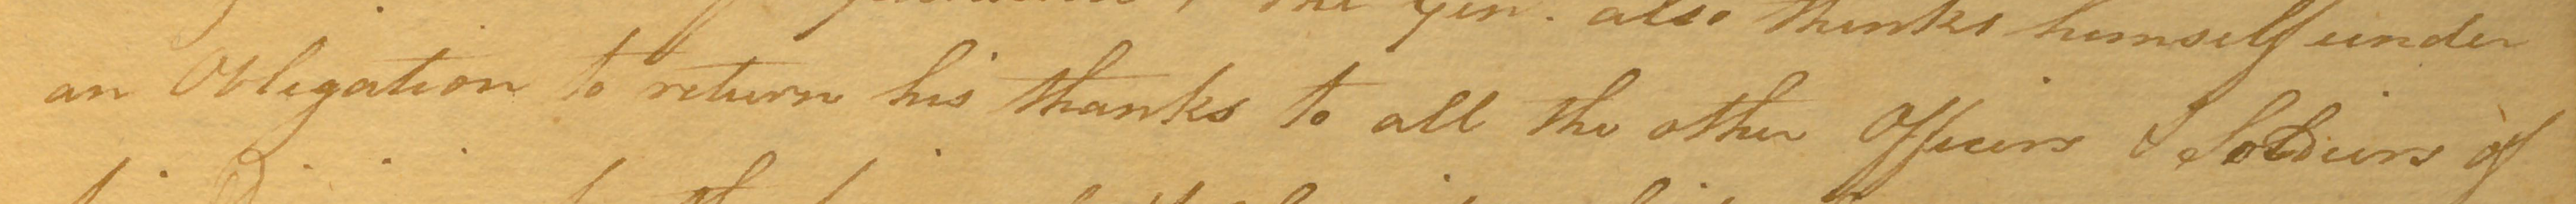an Obligation to return his thanks to all the other Officers & Soldiers of
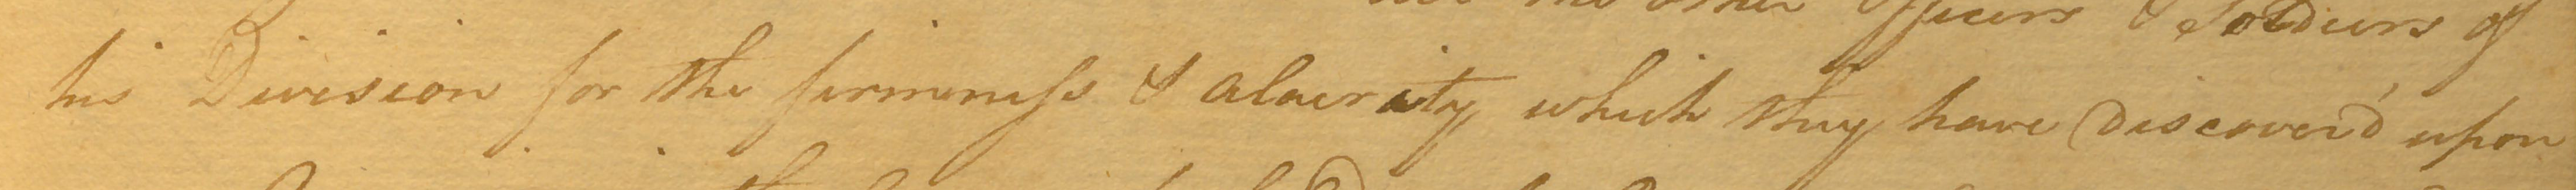his Division for the firmness & alacrity which they have discover'd upon
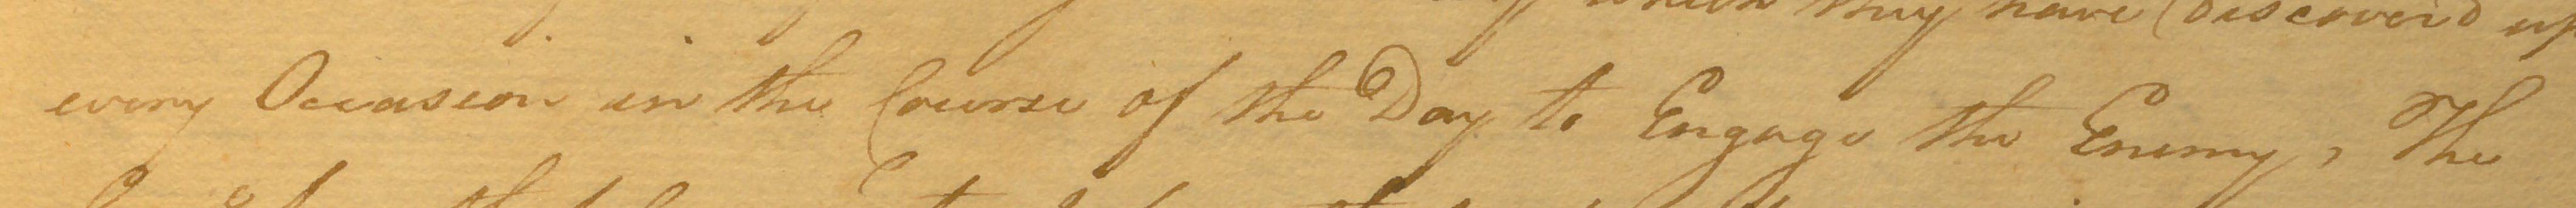every Occasion in the Course of the Day to Engage the Enemy, The
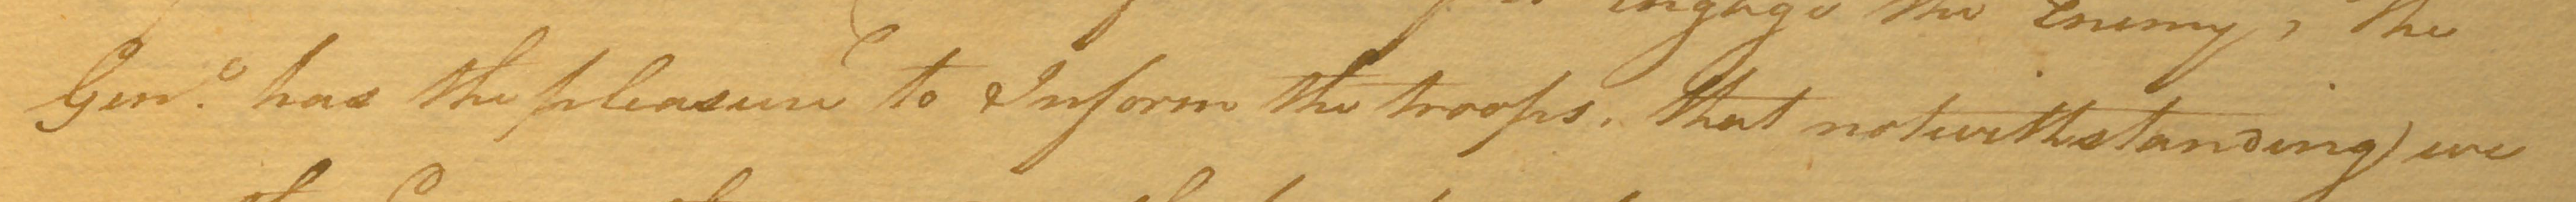Gen^l. has the pleasure to Inform the troops, that notwithstanding we
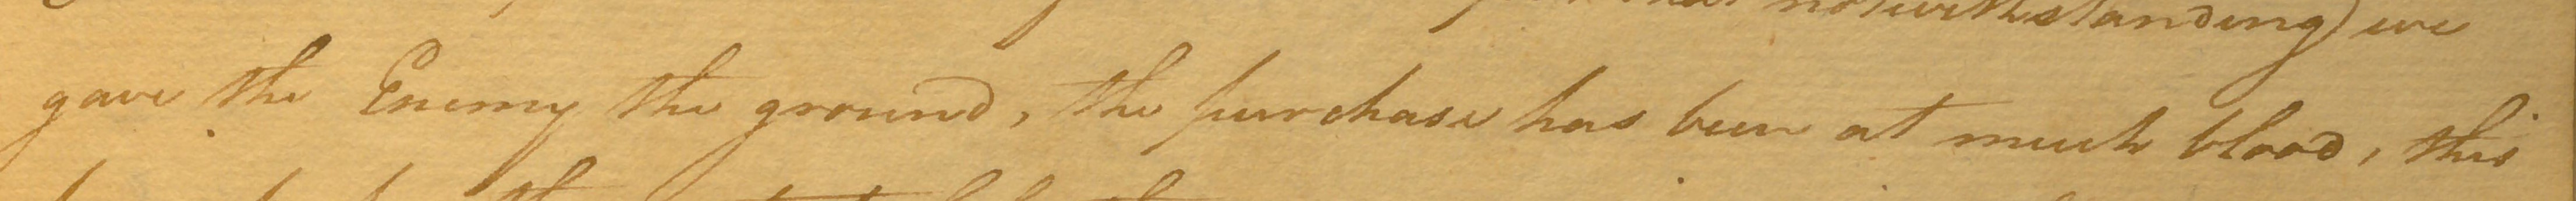gave the Enemy the ground, the purchase has been at much blood, this
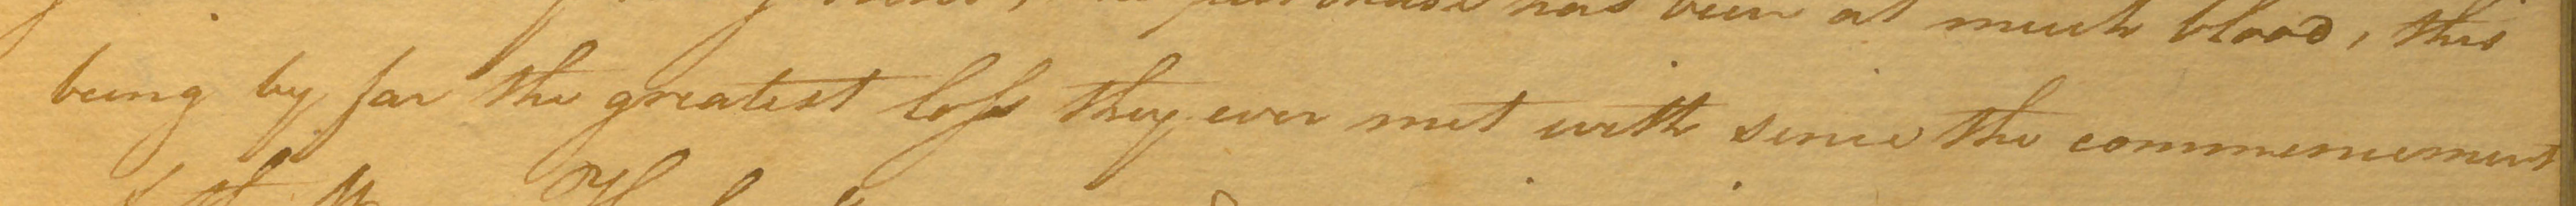being by far the greatest loss they ever met with since the commencement
